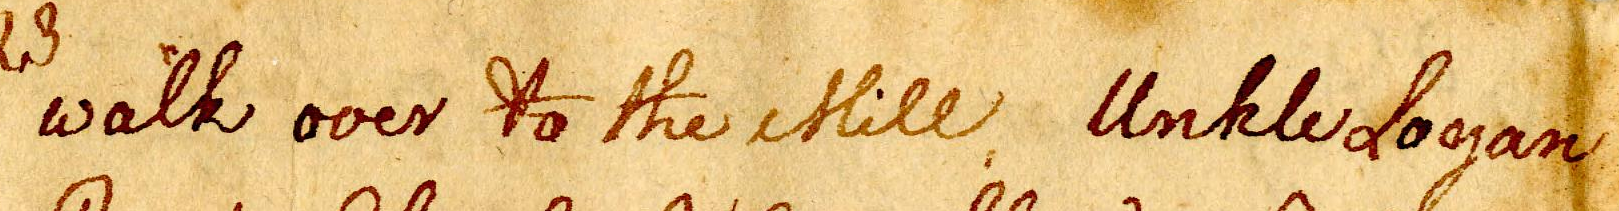walk over to the Hill, Unkle Logan
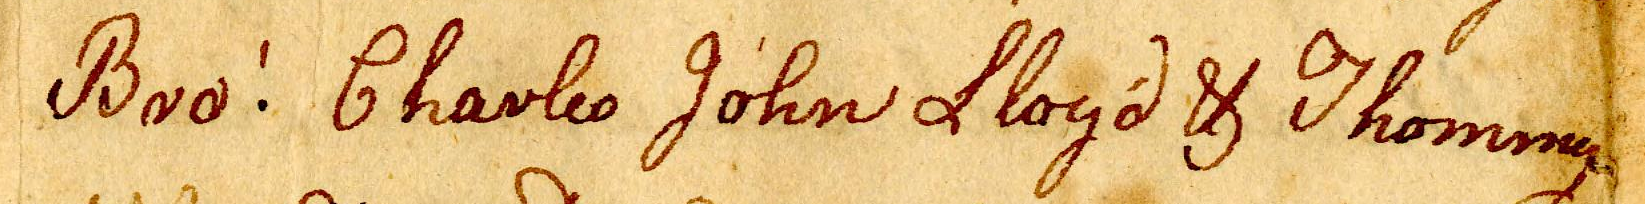Bro' Charles John Lloyd & Thommy
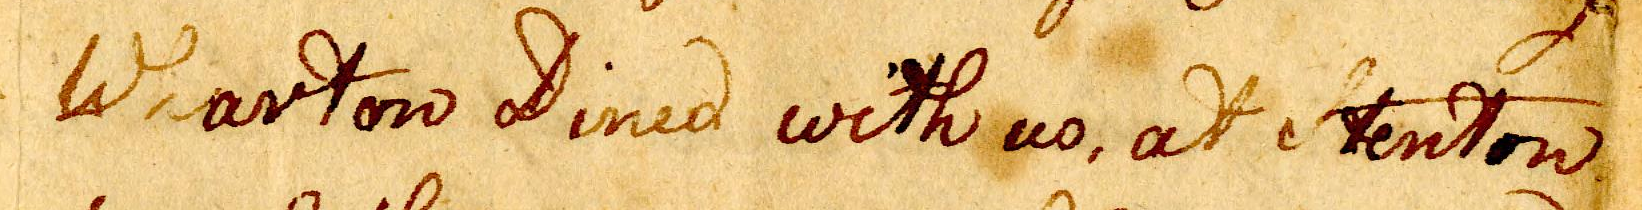Wharton Dined with us, at Stenton
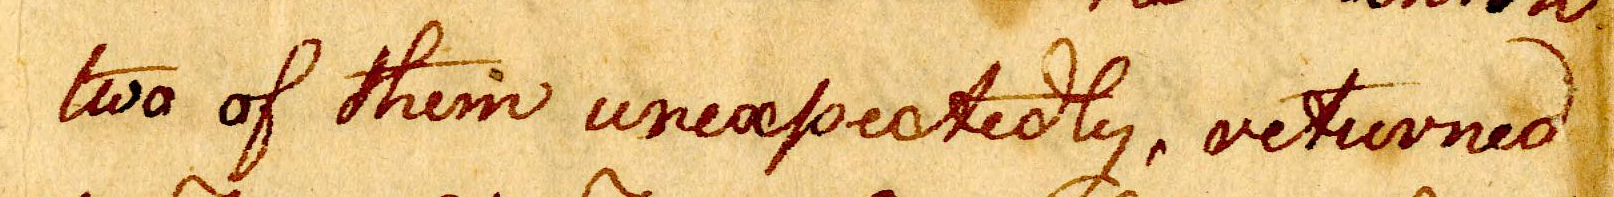two of them unexpectedly, returned
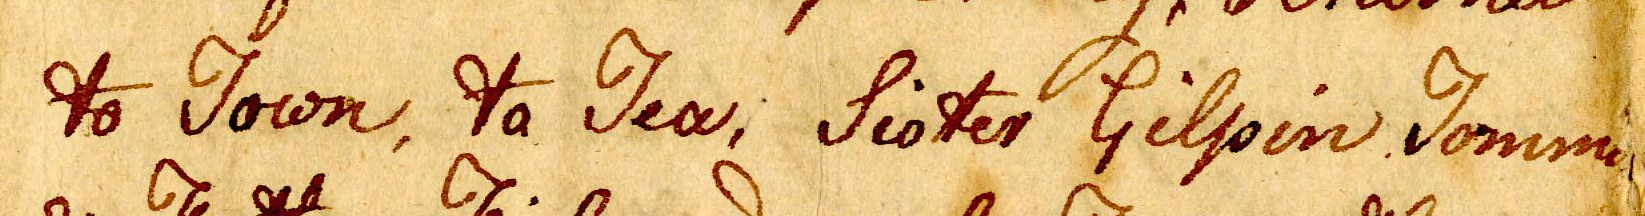to Town, to Tea, Sister Gilpin Tommy
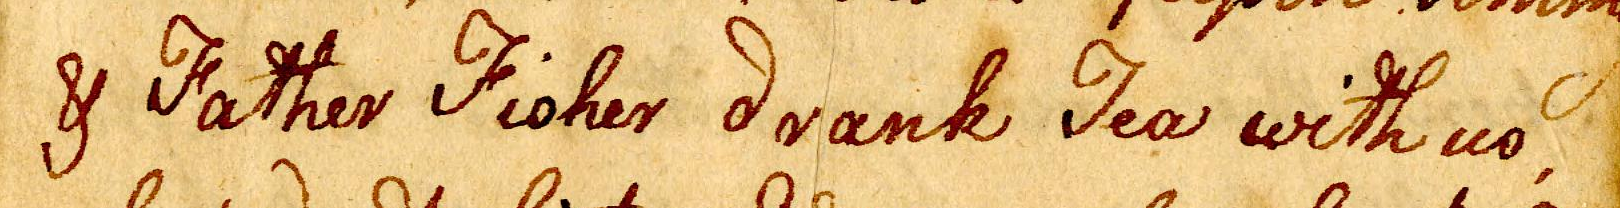& Father Fisher drank Tea with us,
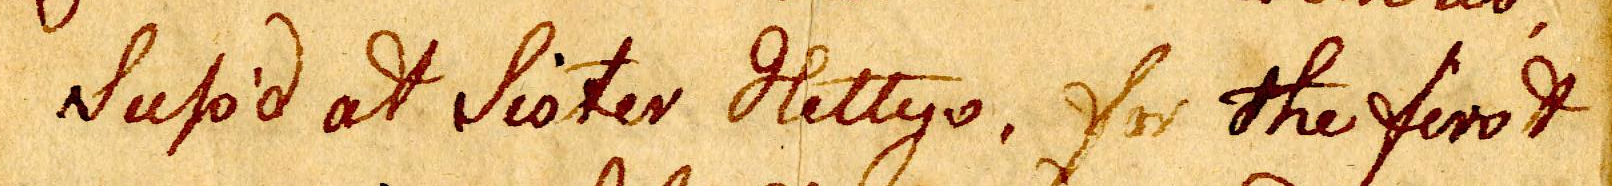Sup'd at Sister Hettys, for the first
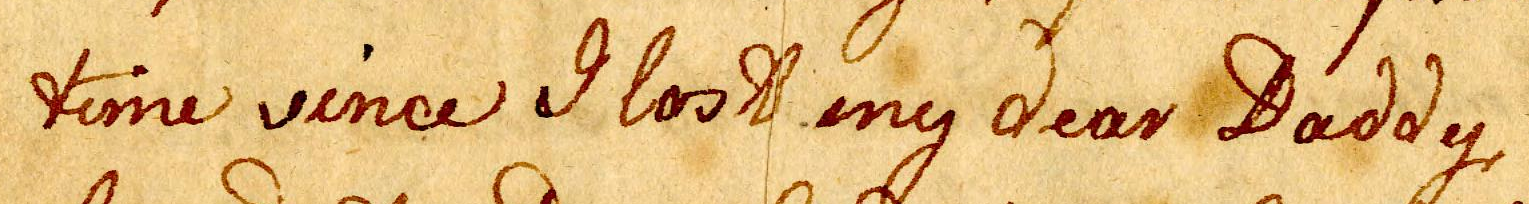time sine I lost my dear Daddy,
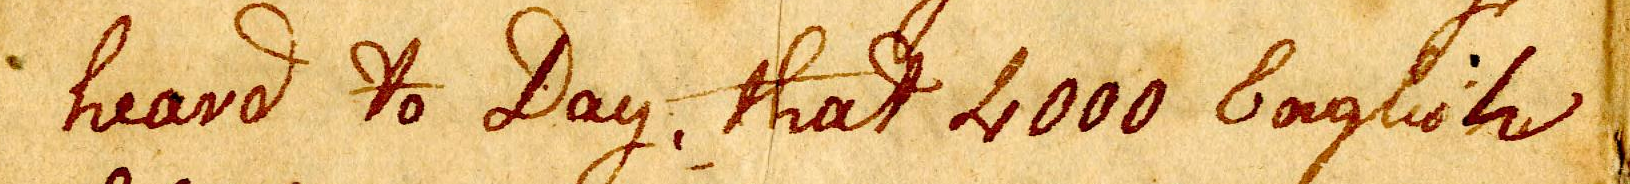heard to Day, that 4000 English
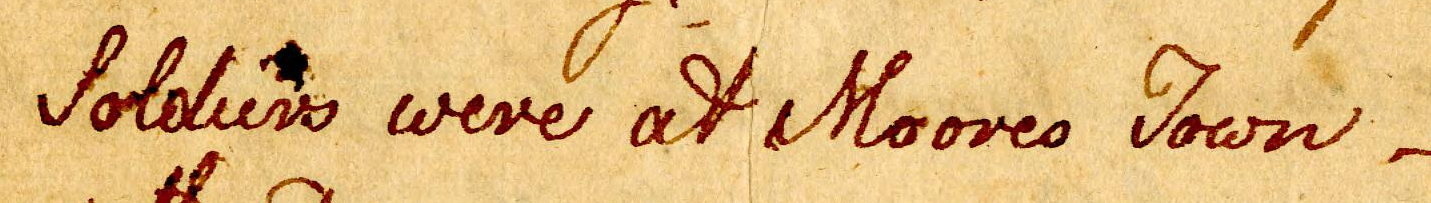Soldiers were at Moores Town -
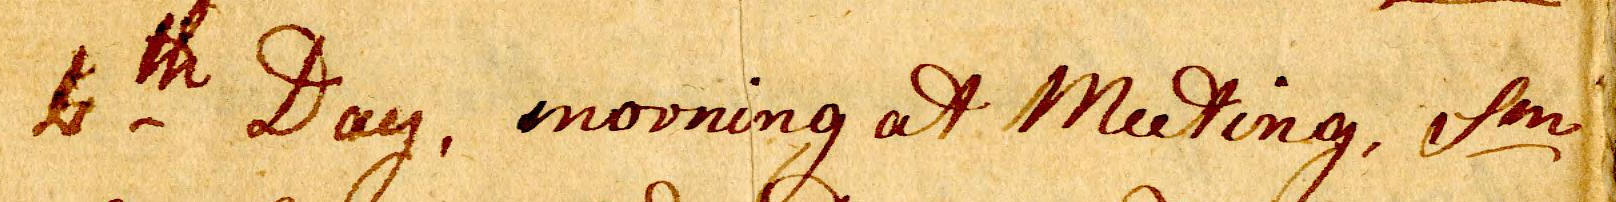4^th Day, morning at Meeting, S^m
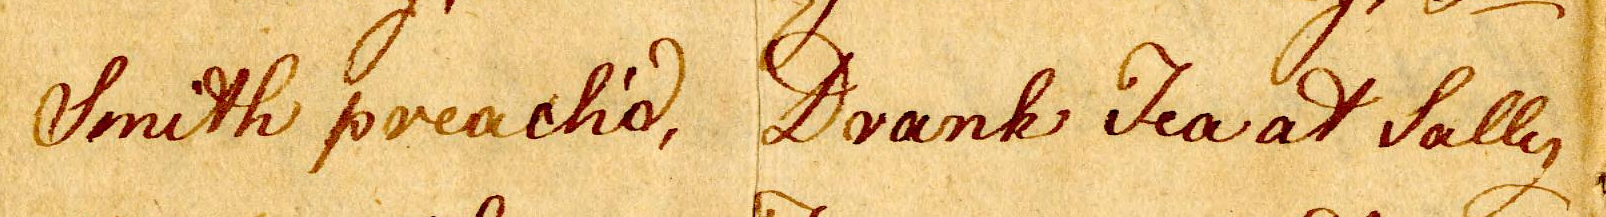Smith preach'd, Drank Tea at Sally
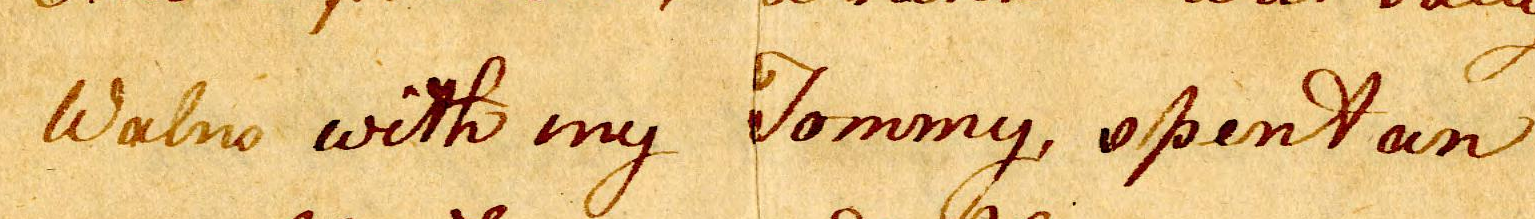Walns with my Tommy, spent an
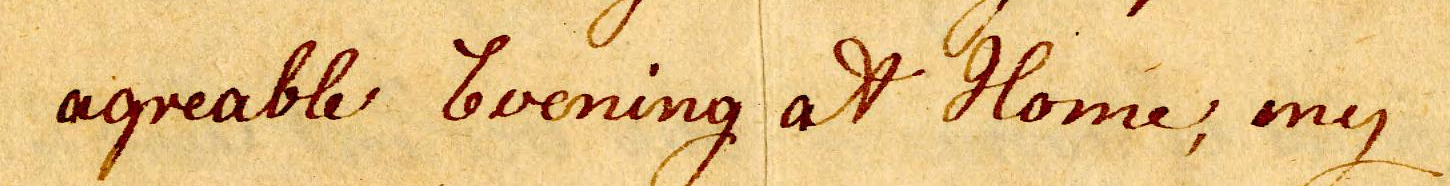agreable Evening at Home, my
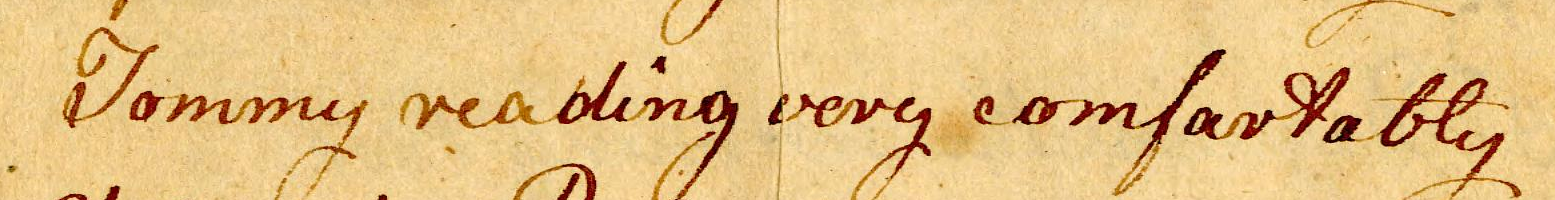Tommy reading very comfortably
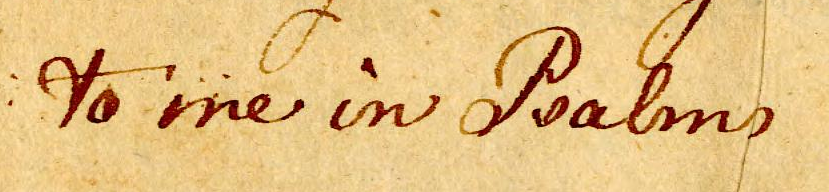to me in Psalms
